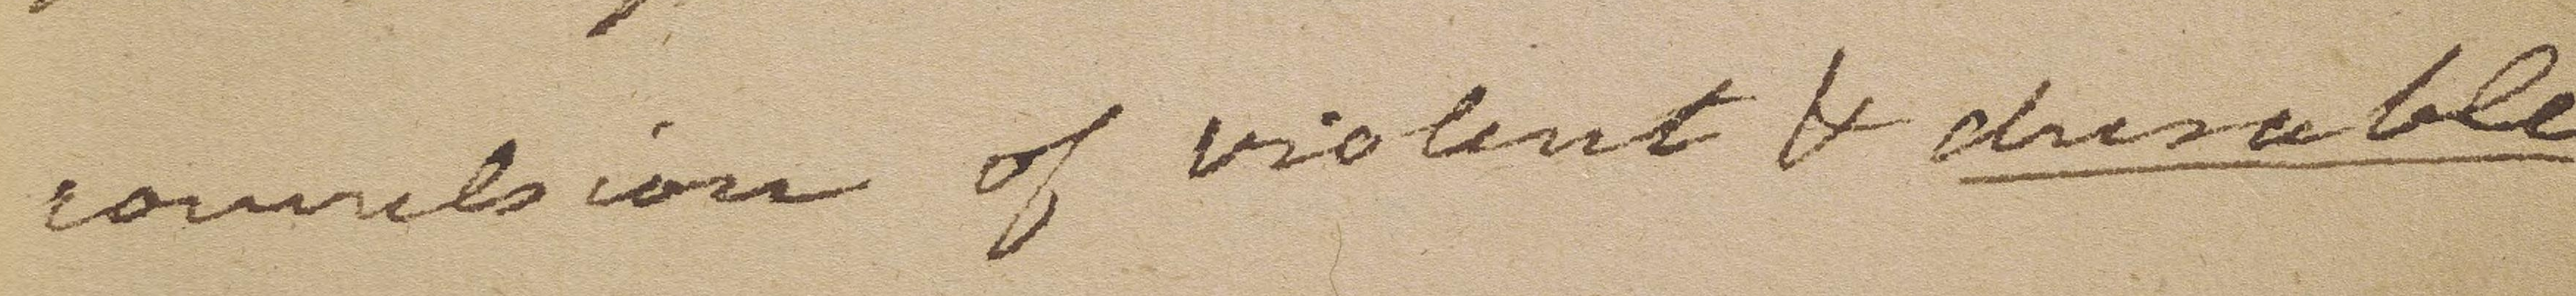convulsion of violent & durable
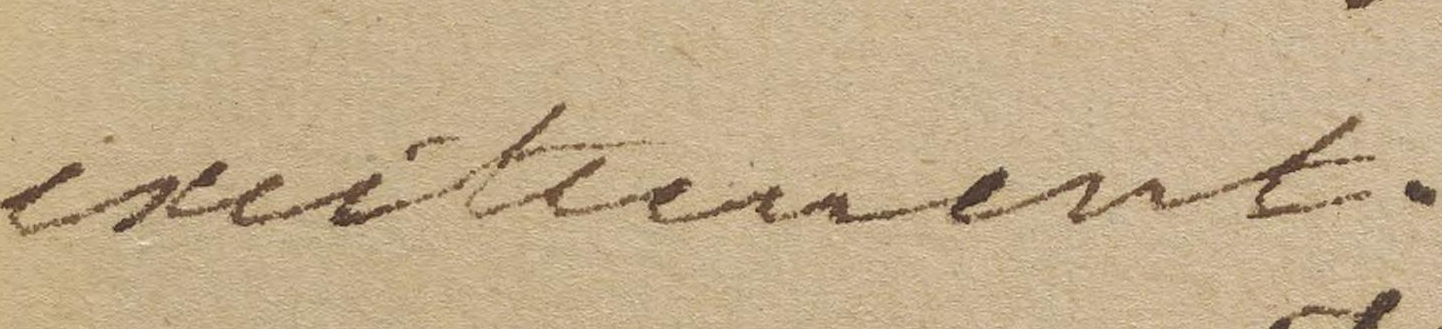excitement.
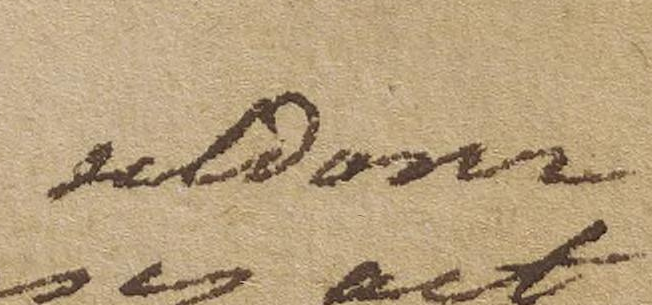seldom
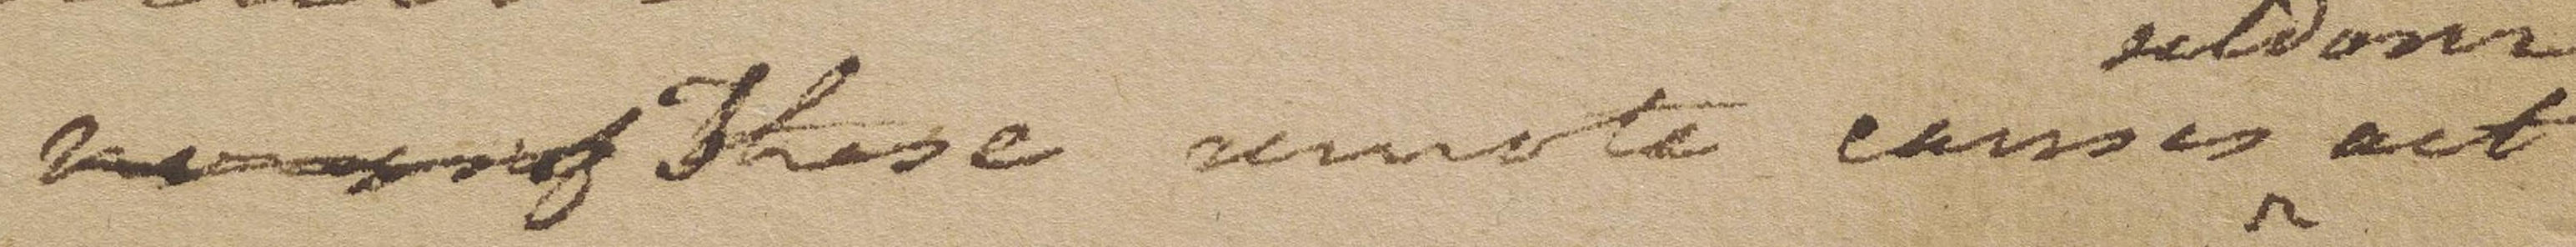[_______] These remote causes ^ act
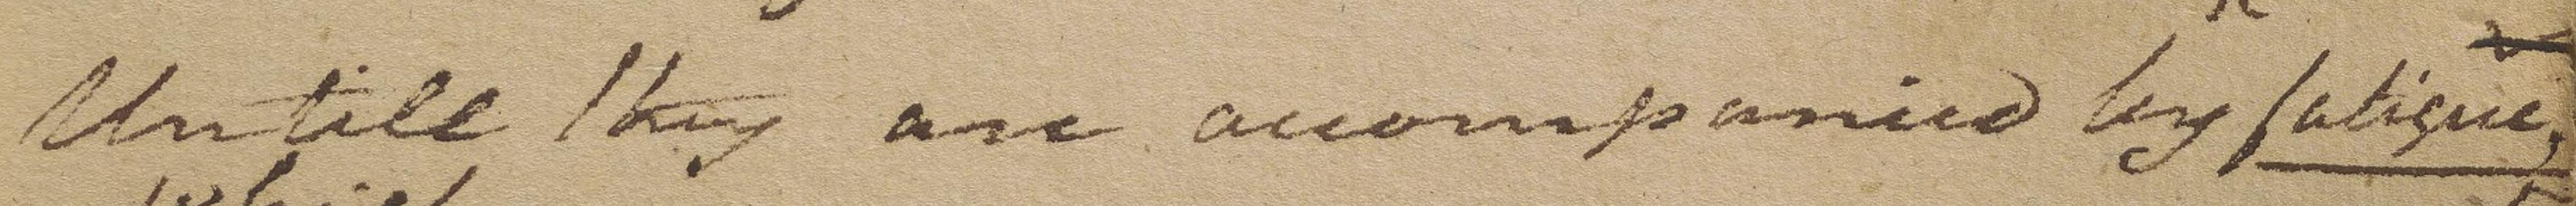Untill they are acompanied by fatigue,
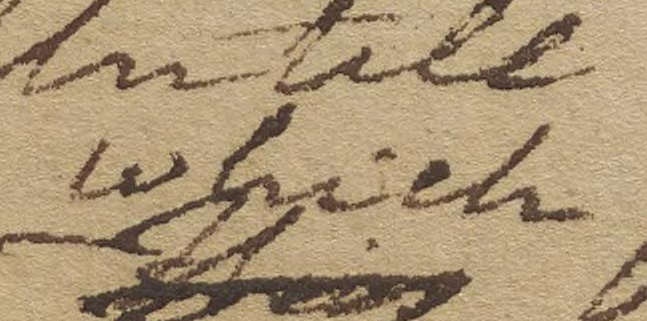which
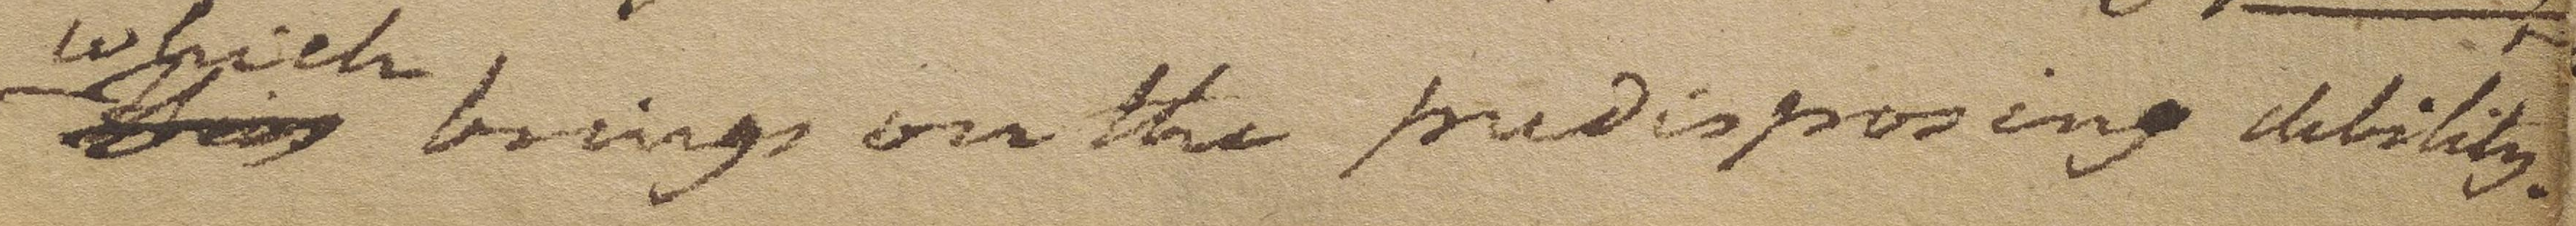which brings on the predisposing debility.
